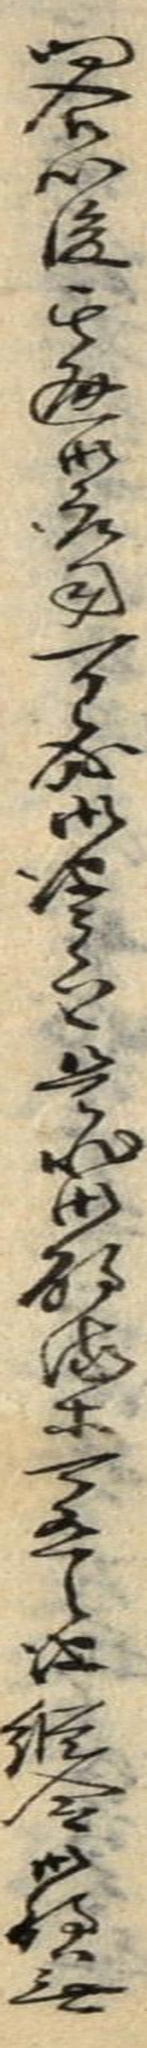問合以後其通御取用可被成御座候ハヽ是非御触流等可有之儀縦令御触ハ無

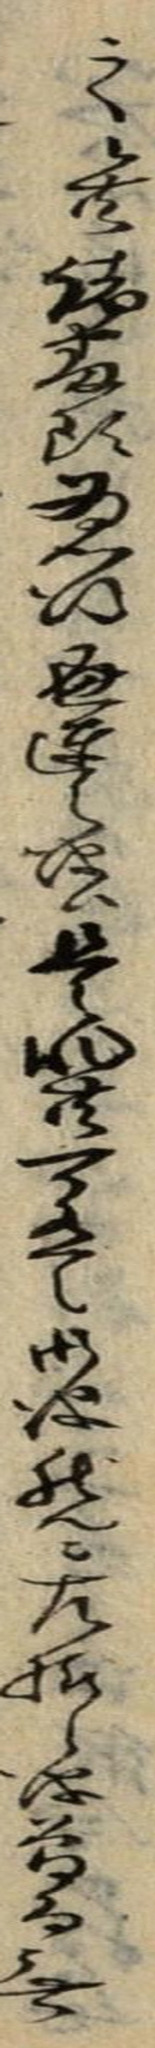之候共諸番頭為心得通達之儀ハ是非共可有之御儀然ルニ左様之儀曾而無
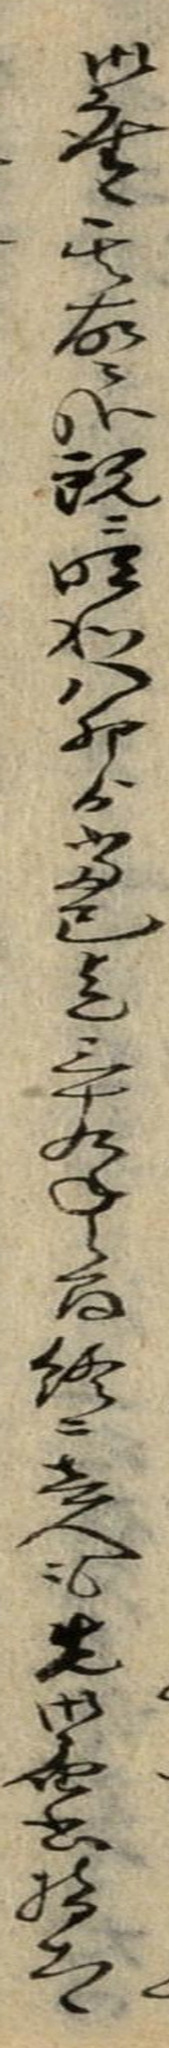御座候其故ニ哉既ニ明和八卯ゟ当巳迄三十九年之間終ニ壱人も先御届書指上候
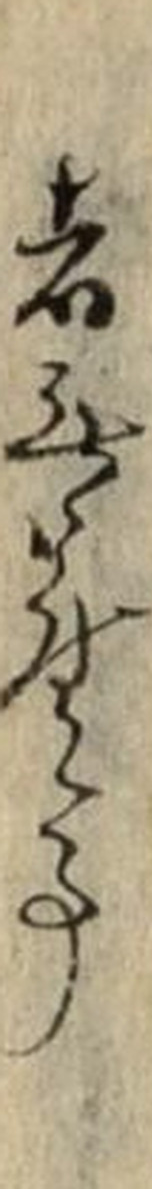者無御座候事
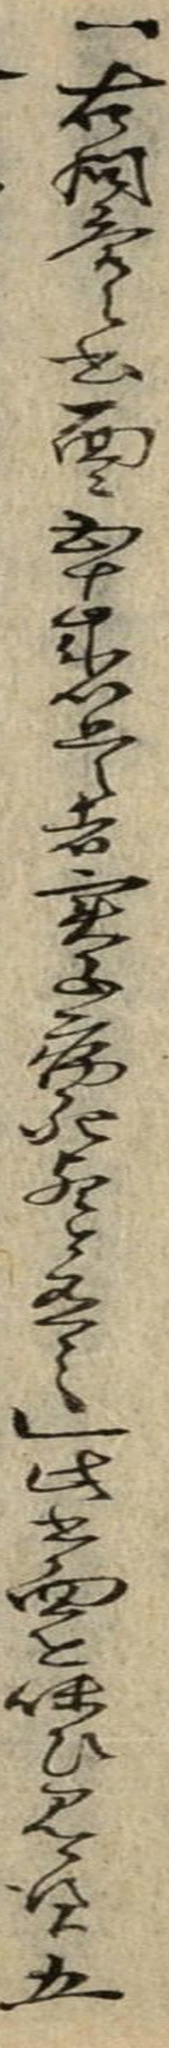一右問合之書面ニ五十歳以上之者実子病死歟と有之」此書面を味ひ見候得ハ五
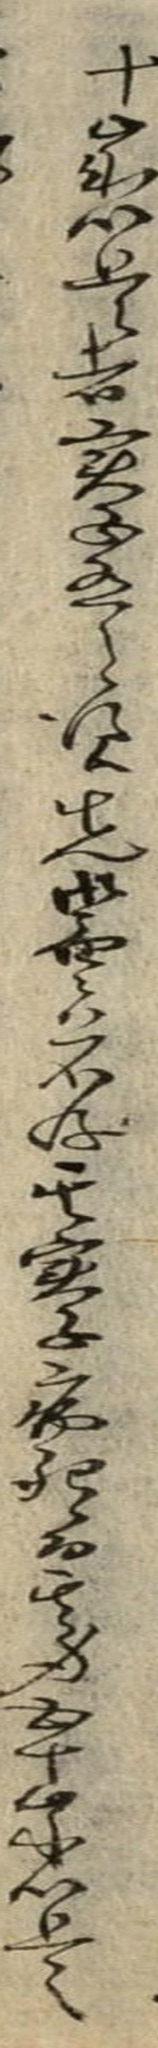十歳以上之者実子有之候得ハ先御届ニハ不及其実子病死ニ而其身五十歳以上之
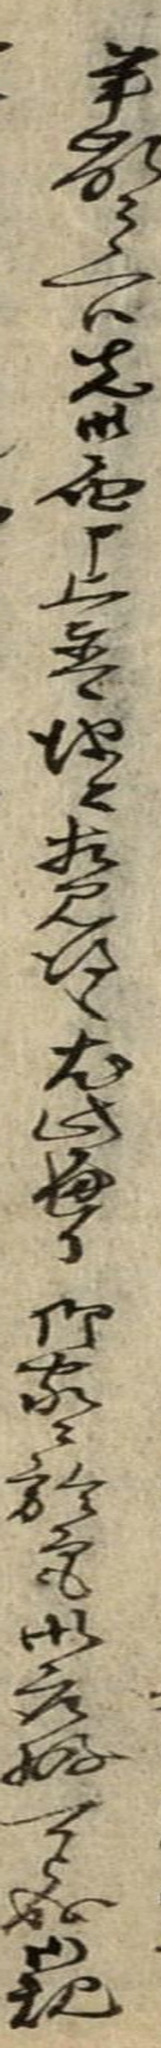年齢ニ候へハ先御届申上置候儀と相見得候尤此通り御家ニ於而も御取扱可被成御規
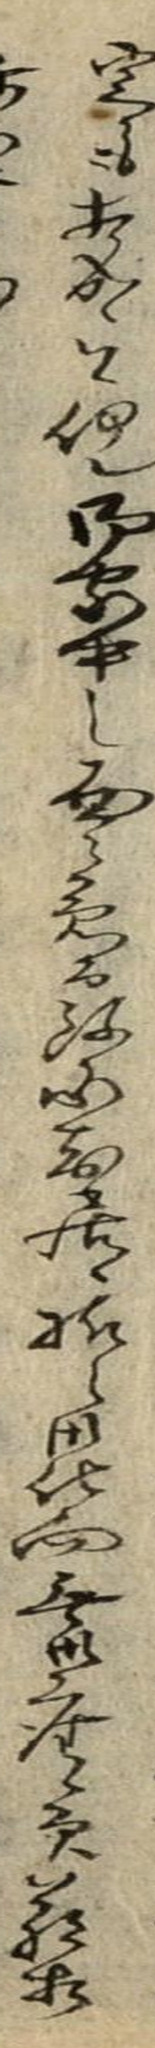定も相成候ハヽ何レ御家中之面々兼而致承知居候様御仕向御無御座候事而ハ難相
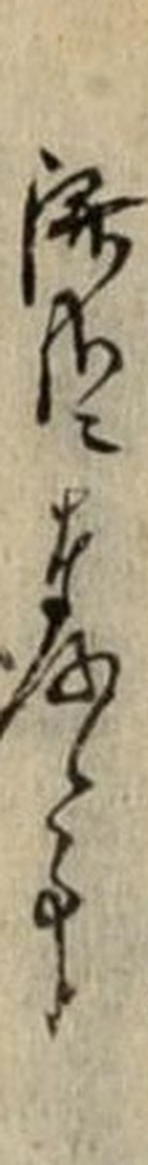済哉ニ奉存候事
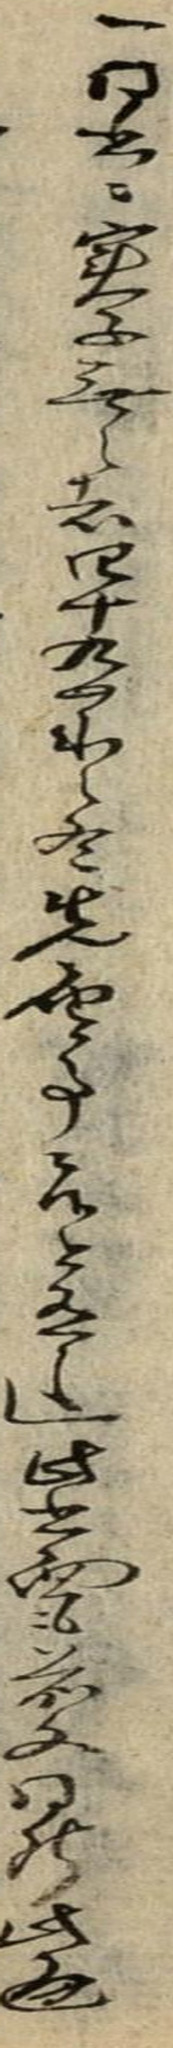一同書ニ実子無之者四十九歳之冬先届事ニ候と有之」此書面も前文同断此通
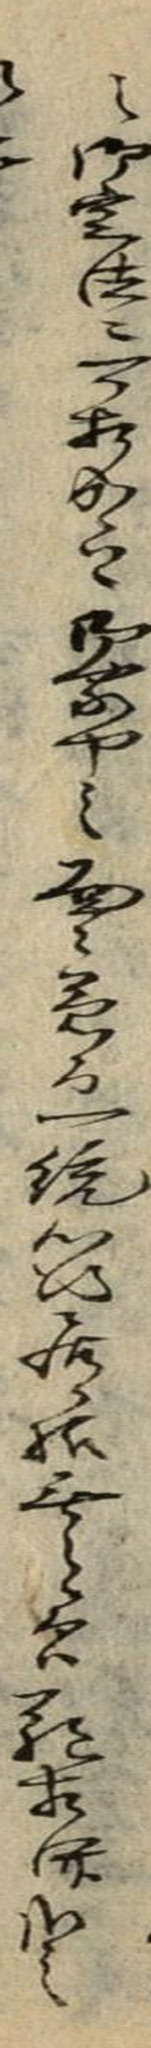之御定法ニ可相成候ハヽ御家中之面々兼而一統心得居候様無之候而ハ難相済哉之
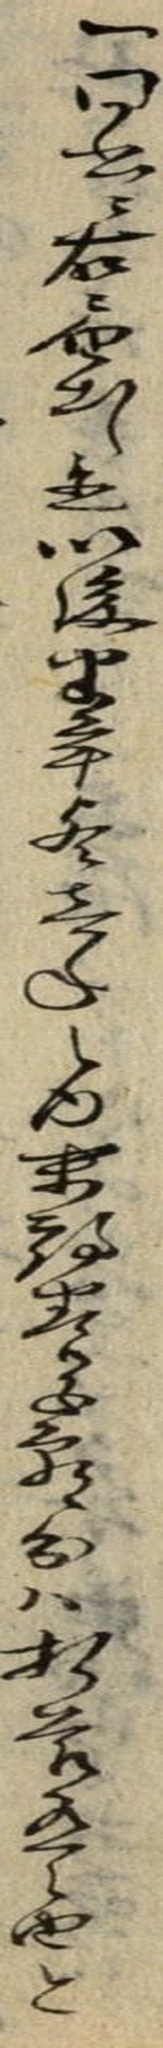一同書ニ右届出し置以後半年歟壱年之内末期養子願候分ハ折節有之由と
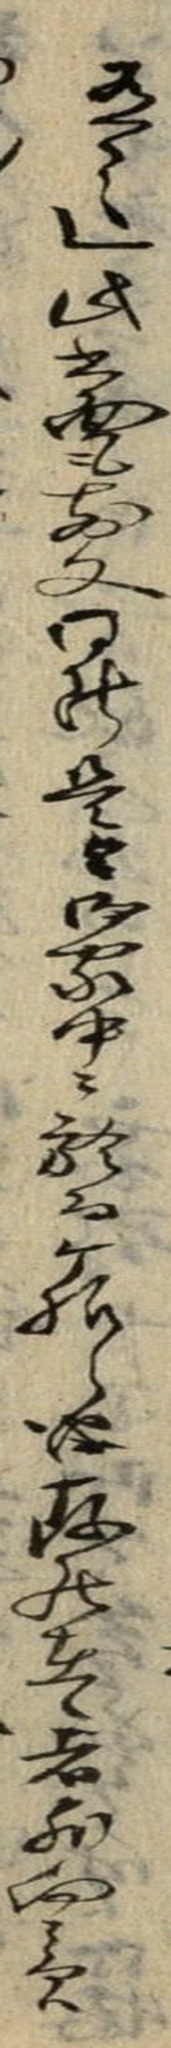有之」此書面も前文同断是御家中ニ於而ケ様之儀存罷在候者外向ニ而ハ
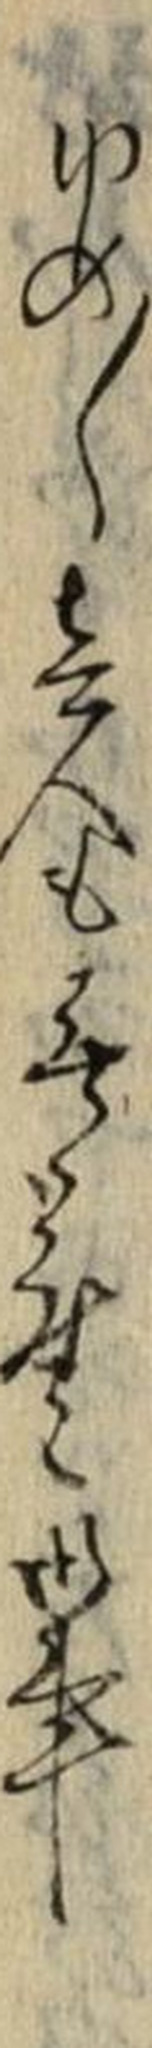ゆめ〳〵壱人も無御座候御事
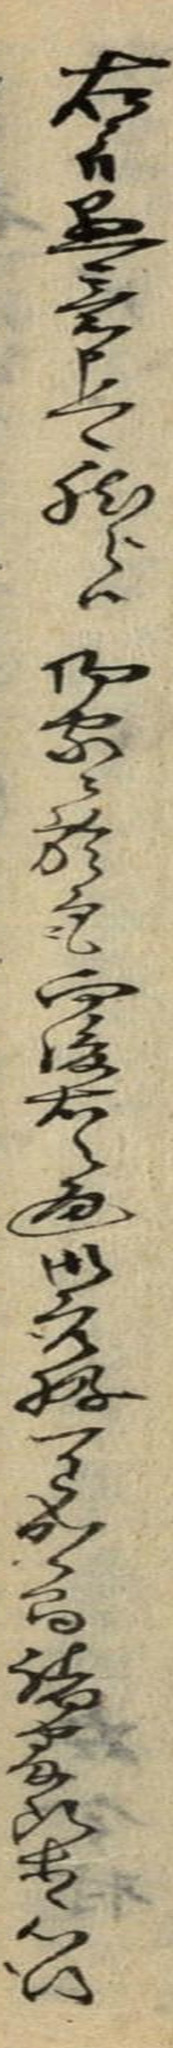右ニ付愚意申上候然らハ御家中ニ於而も向後右之通御取扱可被成候間諸番頭等ヘ心得
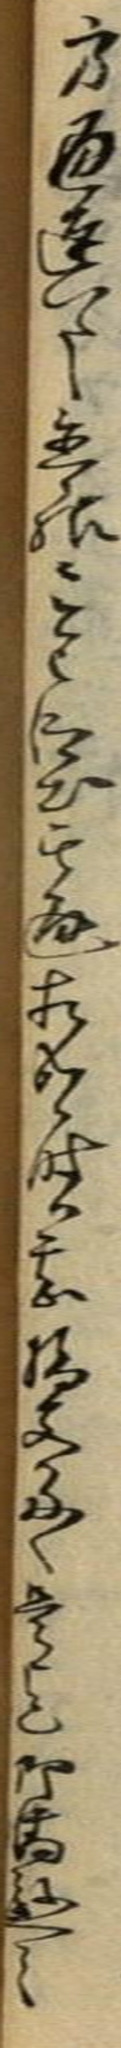方通達いたし置候様ニと被仰出其通相成候時ハ甚指支多く是迄御憐愍之
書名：養子縁組之部
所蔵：福井県文書館 Fukui Prefectural Archives
